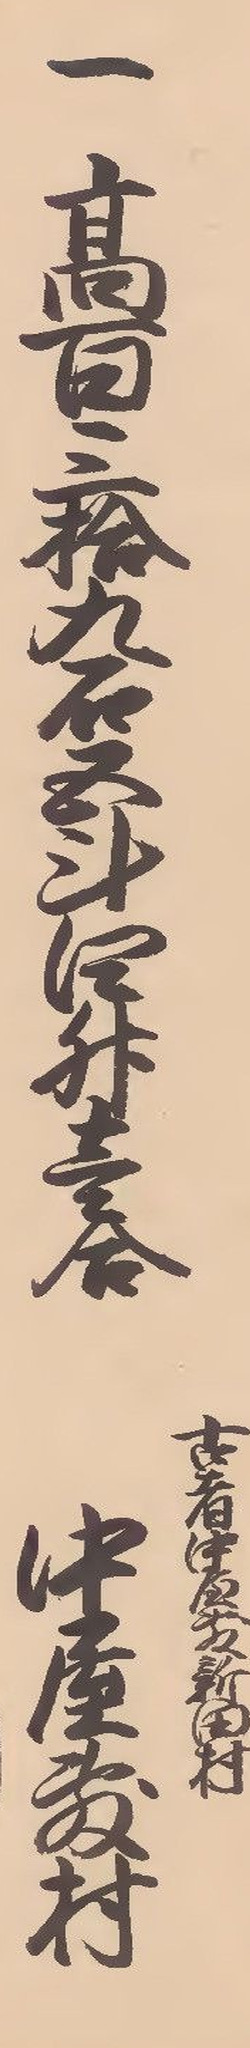一高百三拾九石五斗四升壱合中屋敷村
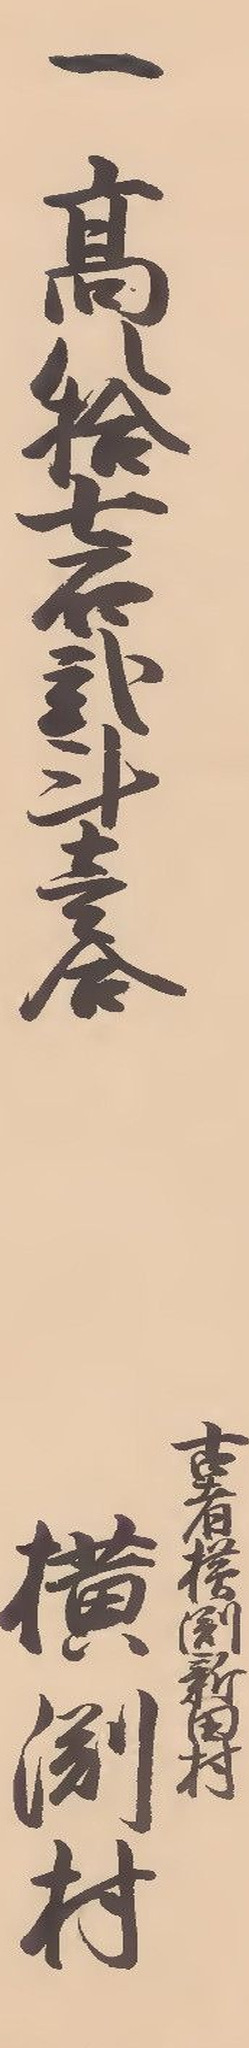一高八拾七石弐斗壱合横淵村
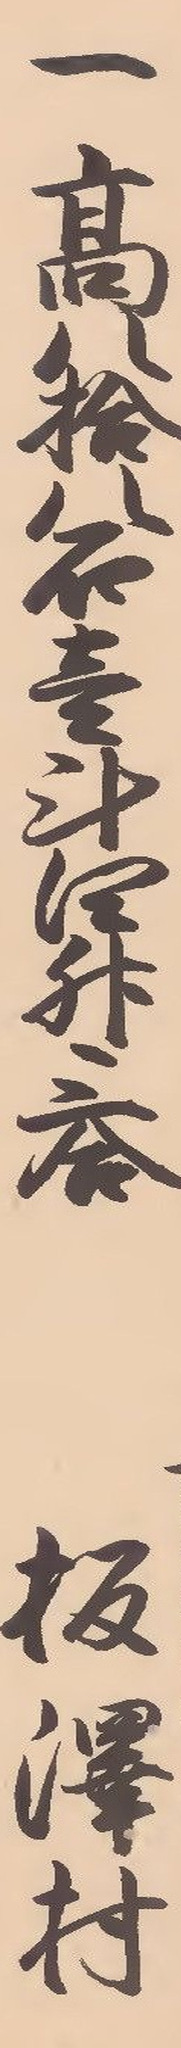一高八拾八石壱斗四升三合板沢村
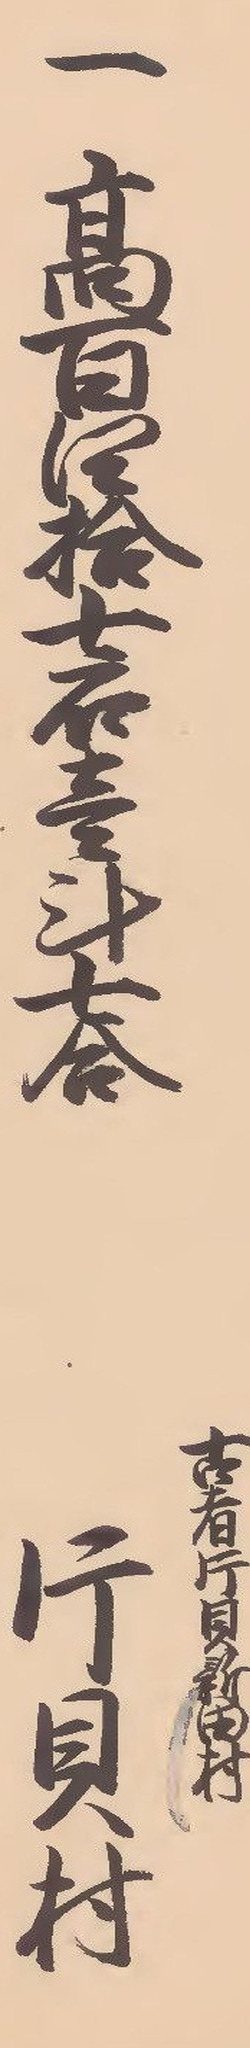一高百四拾七石壱斗七合片貝村

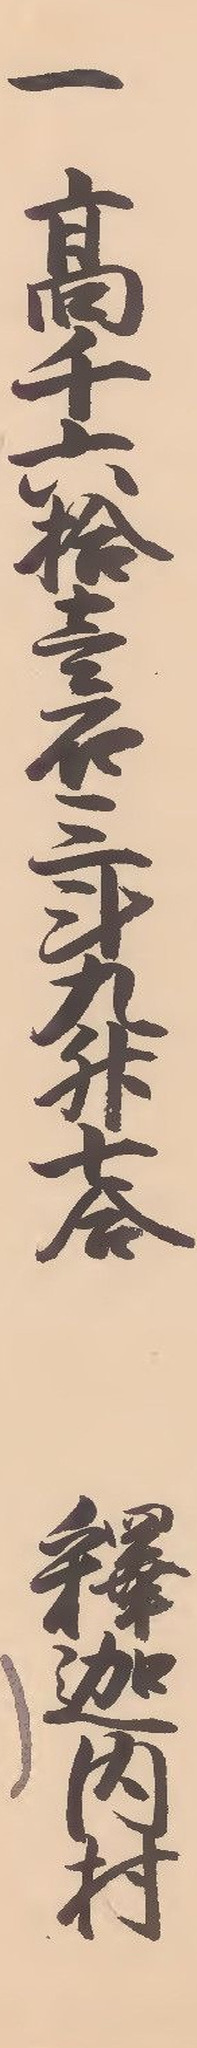一高千六拾壱石三斗九升七合釈迦内村
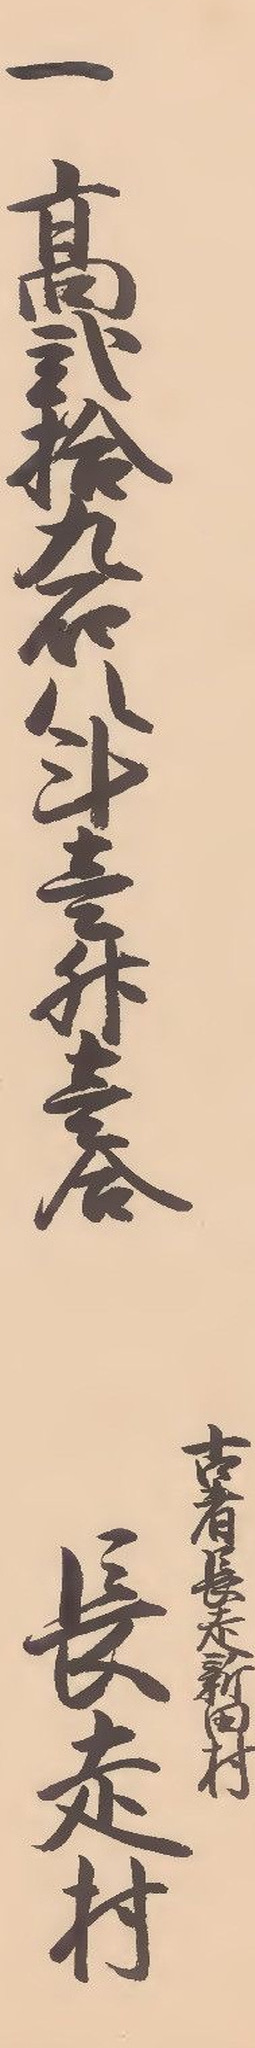一高弐拾九石八斗壱升壱合長走村
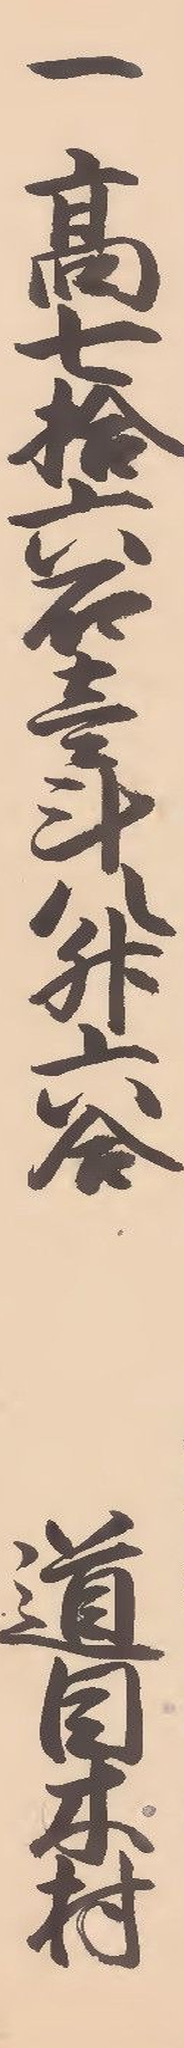一高七拾六石壱斗八升六合道目木村
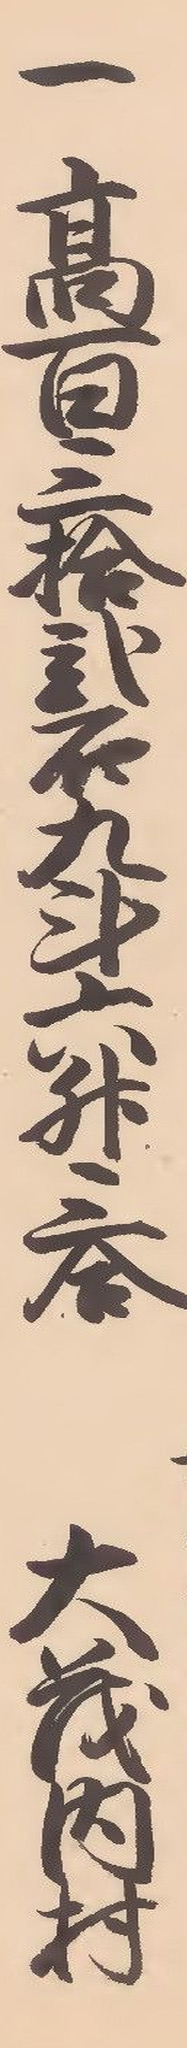一高百三拾弐石九斗六升三合大茂内村
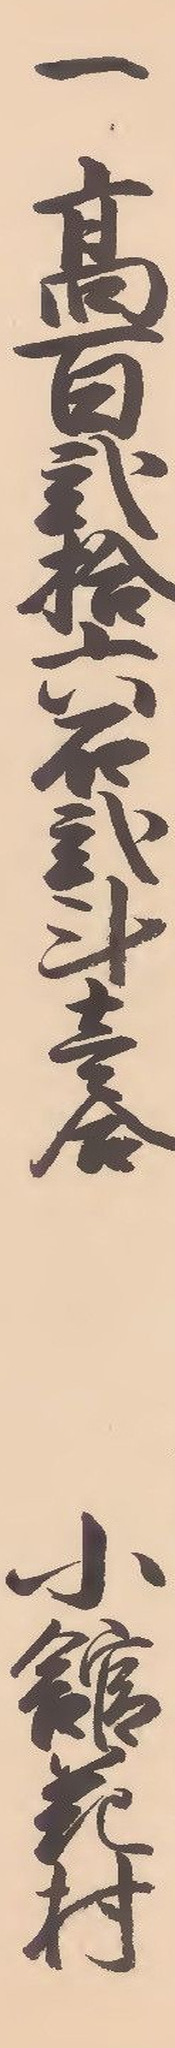一高百弐拾六石弐斗壱合小館花村
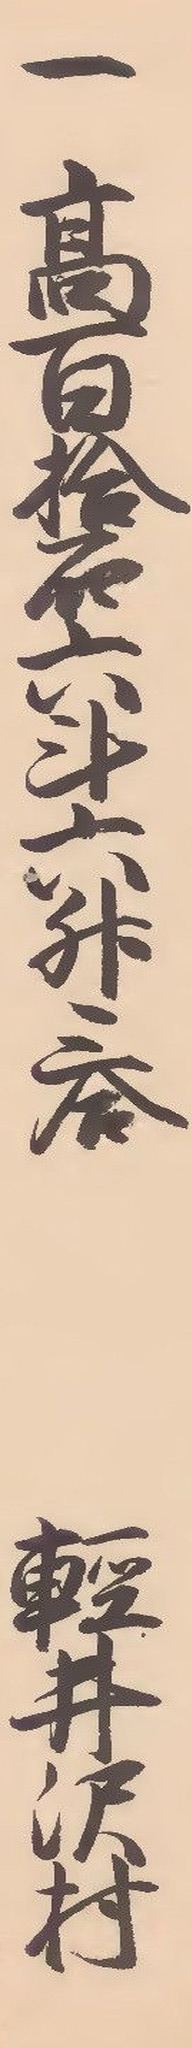一高百拾石六斗六升三合軽井沢村

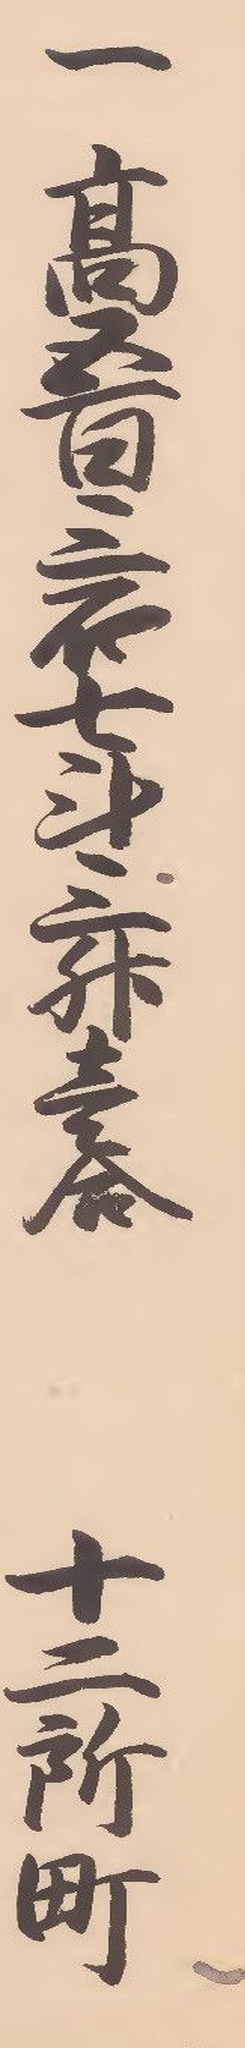一高五百三石七斗三升壱合十二所町
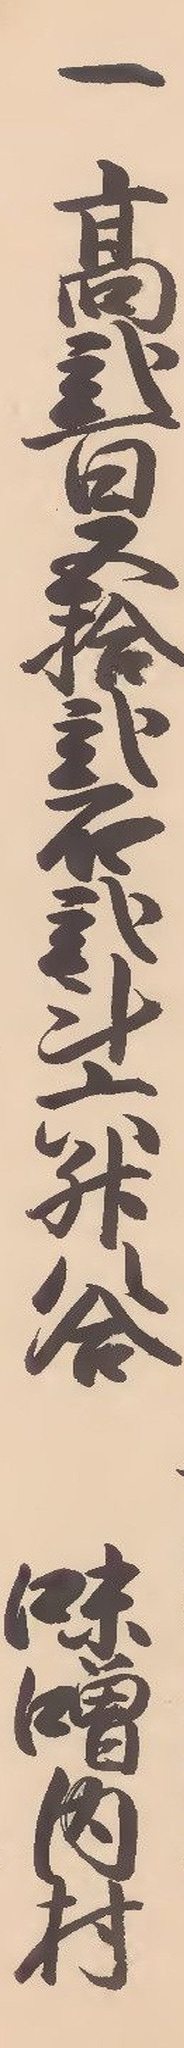一高弐百五拾弐石弐斗六升八合味噌内村
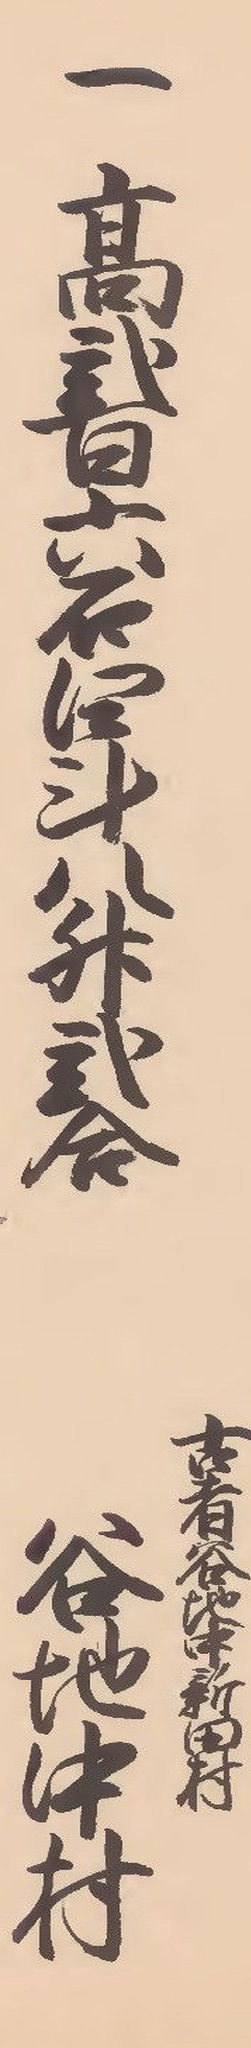一高弐百六石四斗八升弐合谷地中村
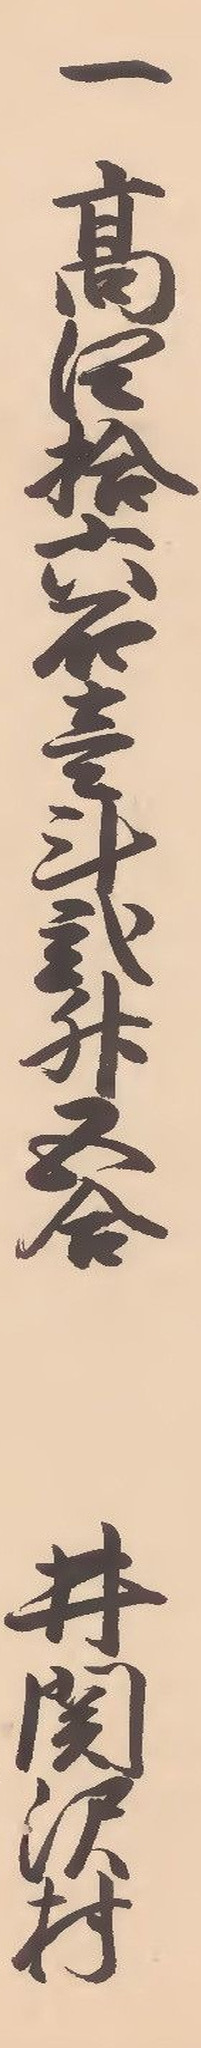一高四拾六石壱斗弐升五合井関沢村
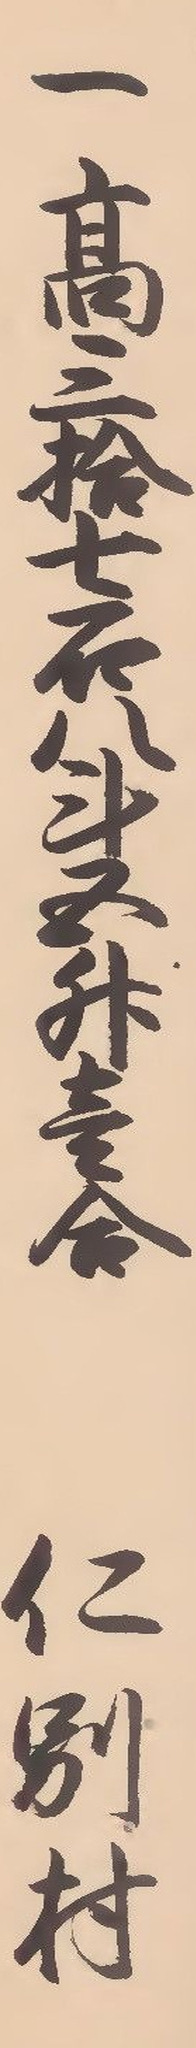一高三拾七石八斗五升壱合仁別村
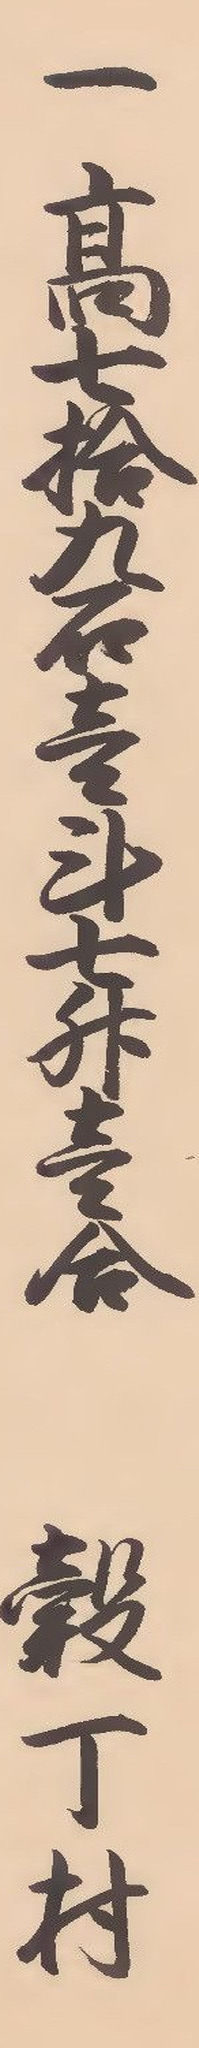一高七拾九石壱斗七升壱合穀丁村
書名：出羽国郷帳　５
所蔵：国立公文書館 National Archives of Japan
